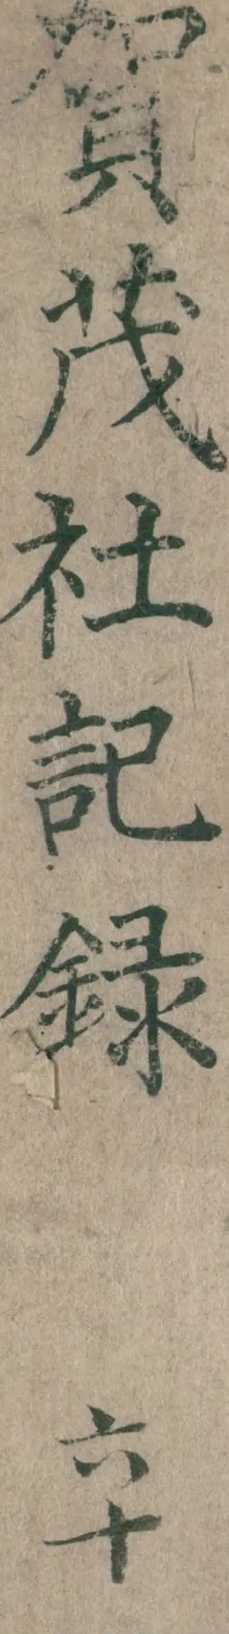賀茂社記録六十

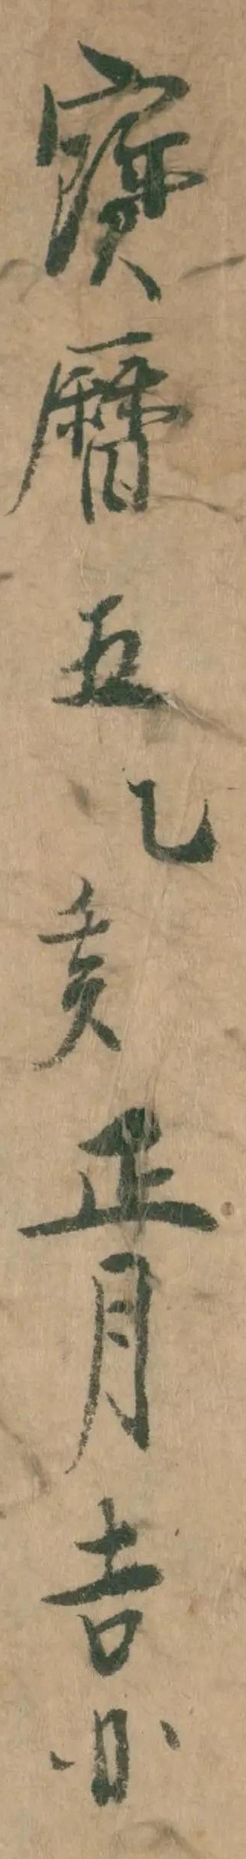宝暦五乙亥正月吉日
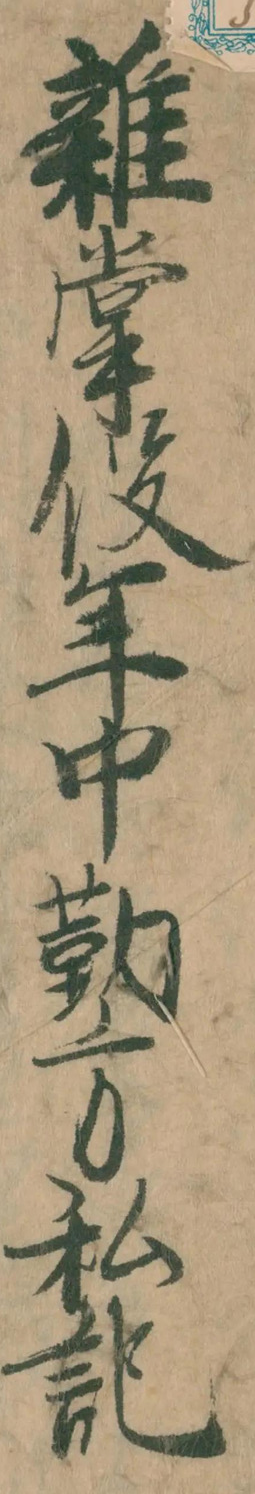雑掌役年中勤方私記
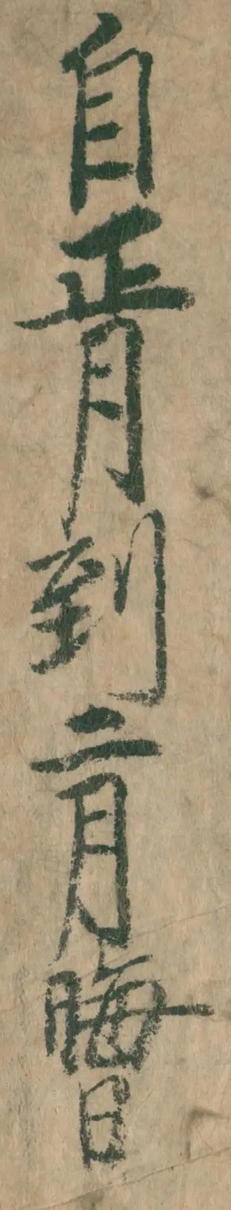自正月到二月晦日
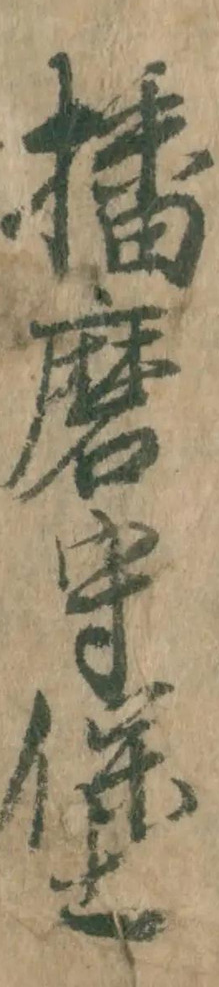播磨守保土

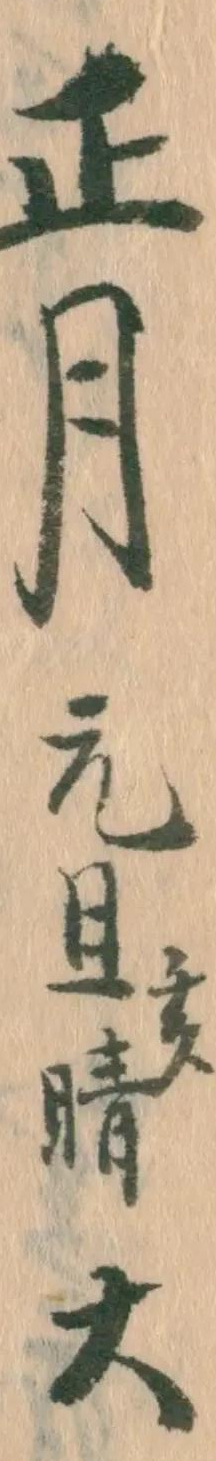正月元旦亥晴大
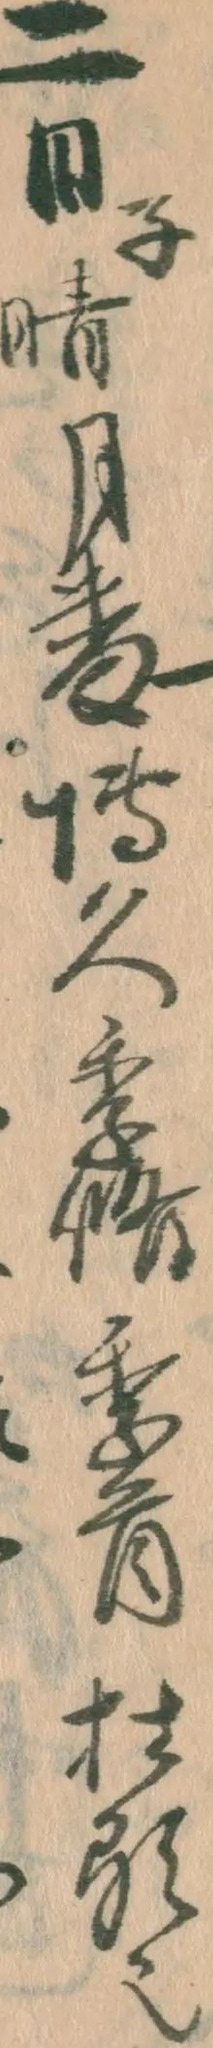二日子晴月番博久季脩季首杜顕也
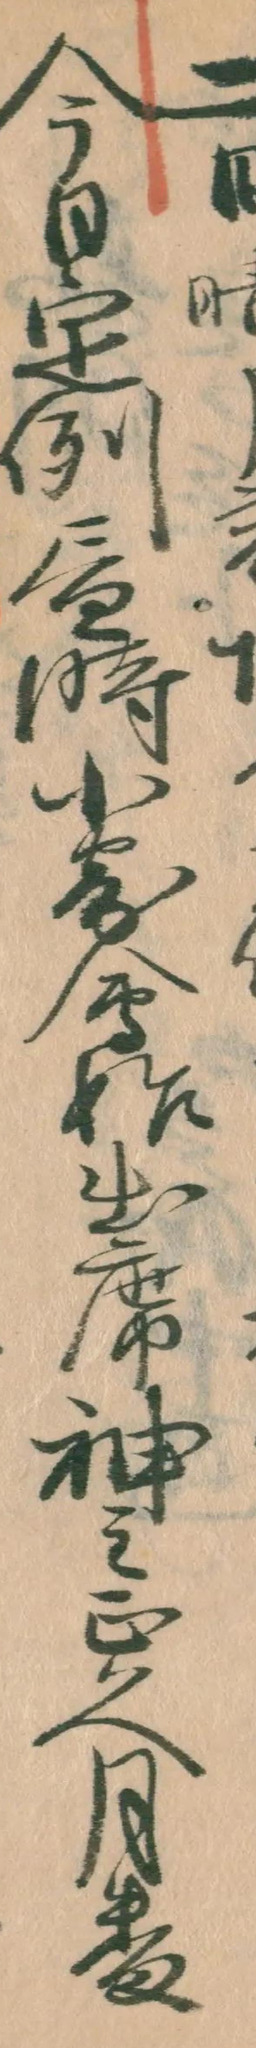一今日定例昼時小寄会始出席神主正久月番
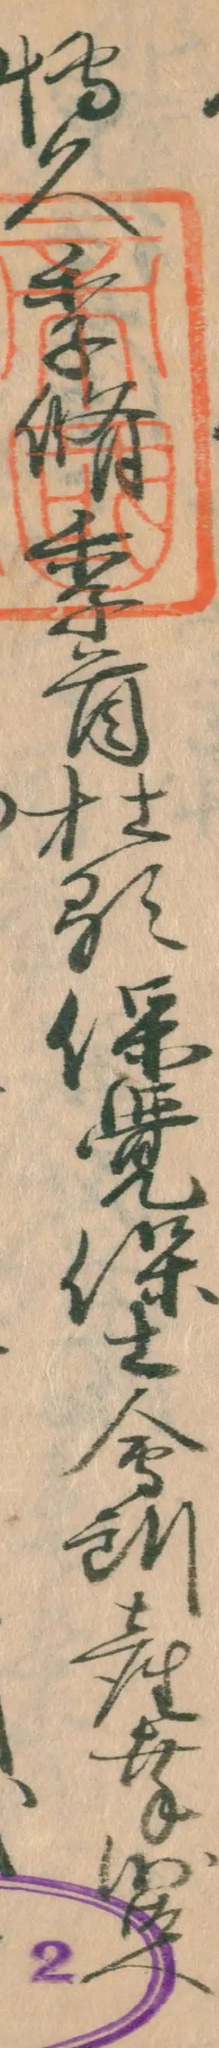博久季脩季首杜顕保覚保士会所産幸沙汰人
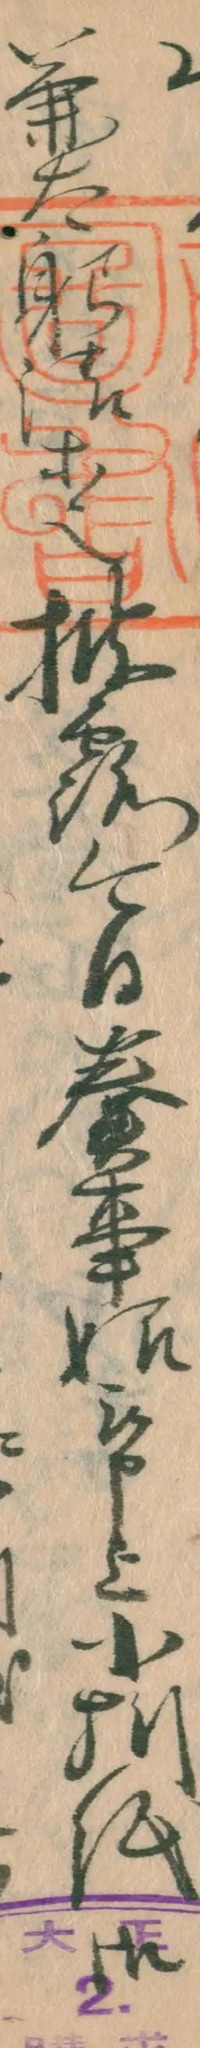兼太躬清等也披露今日奏事始被申上小折紙御
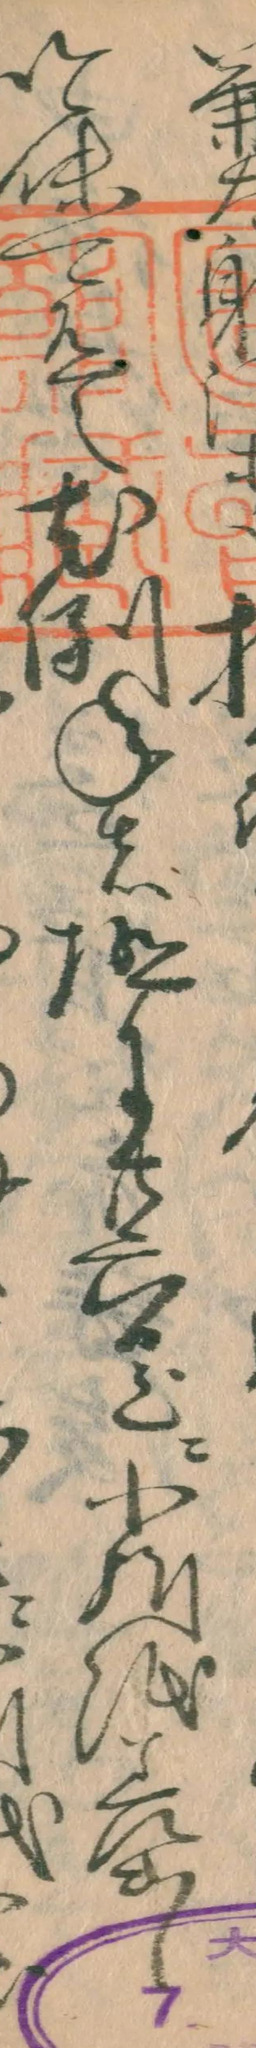吟味可有之尤例年者極月廿六日迄ニ小折紙差出し
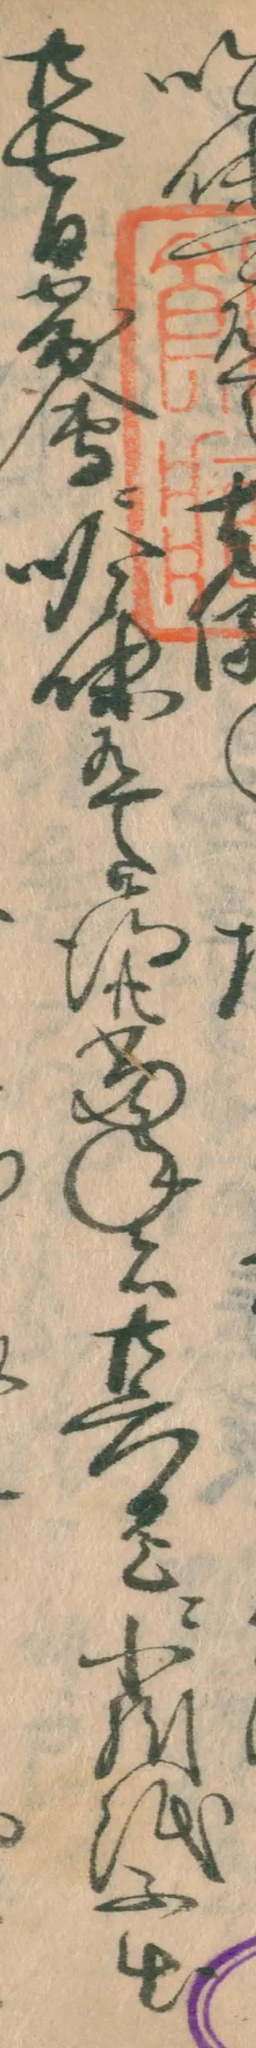廿七日寄会ニ吟味有之候得共当年者廿六日迄ニ小折紙不出
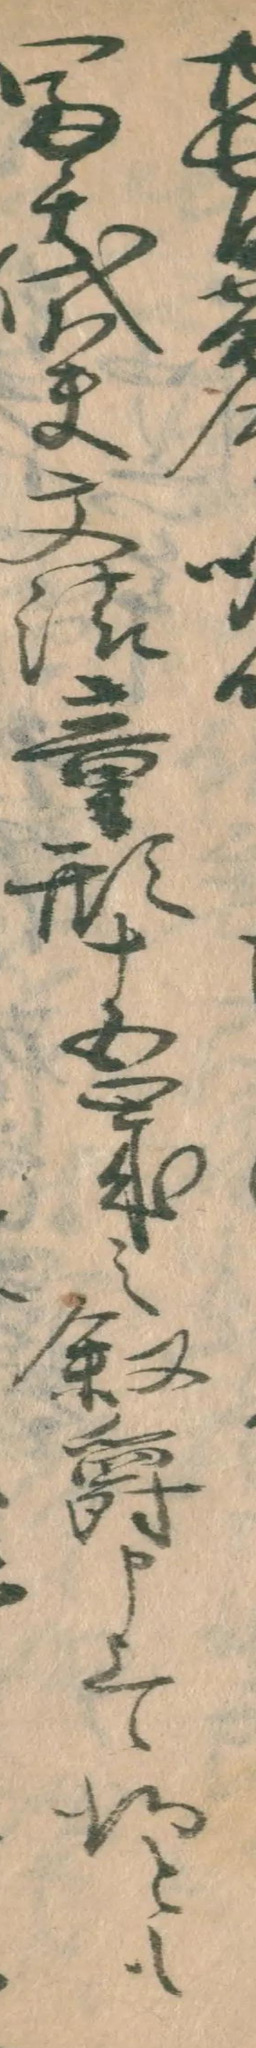富千代大夫文清童形十五歳之叙爵申上候得とも
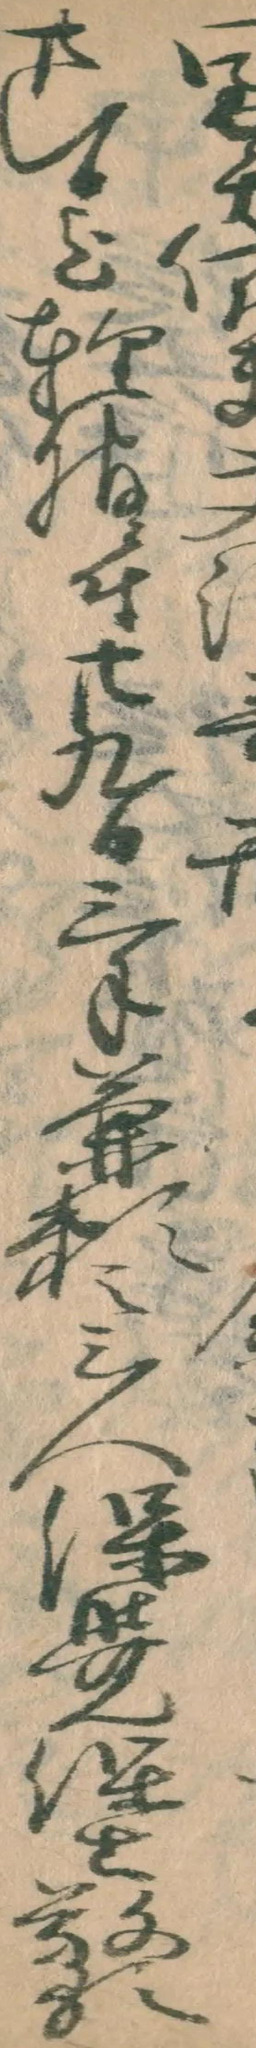廿八日迄軽服ニ付廿九日三月兼頼之三人保覚保土敬顕
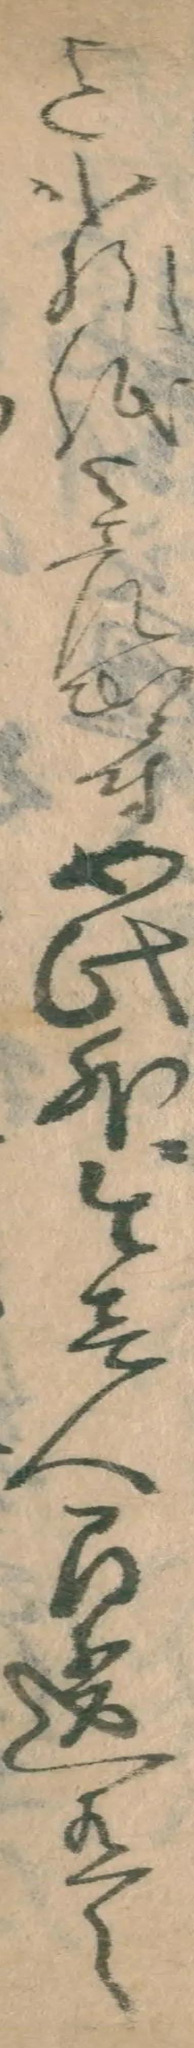迄小折紙被差出ニ付如此外ニ今壱人間違有之
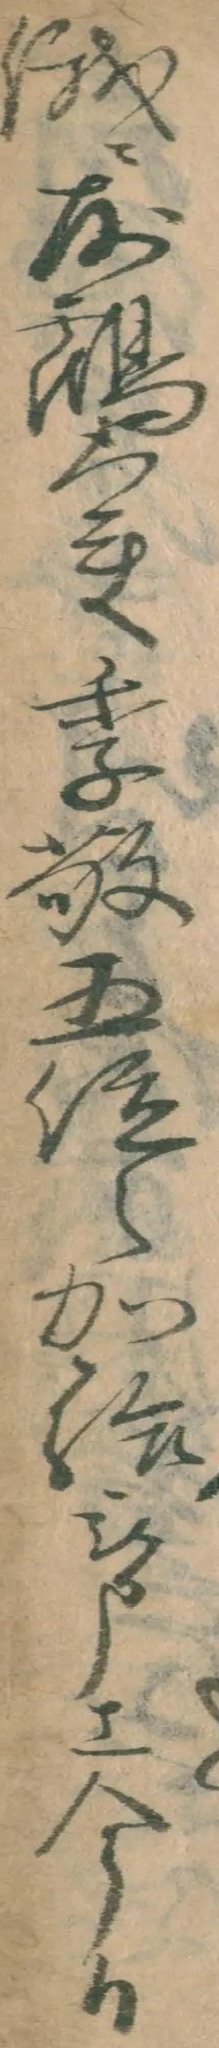俄ニ友鶴大夫季敬五位之加給被申上今日
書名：賀茂社記録. 第60冊
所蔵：国立国会図書館 National Diet Library, JAPAN
